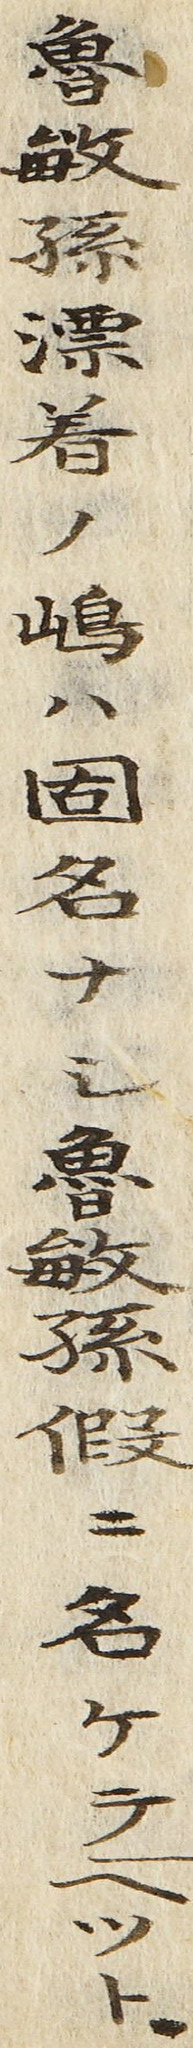魯敏孫漂着ノ島ハ固名ナシ魯敏孫仮ニ名ケテ「ヘツト・
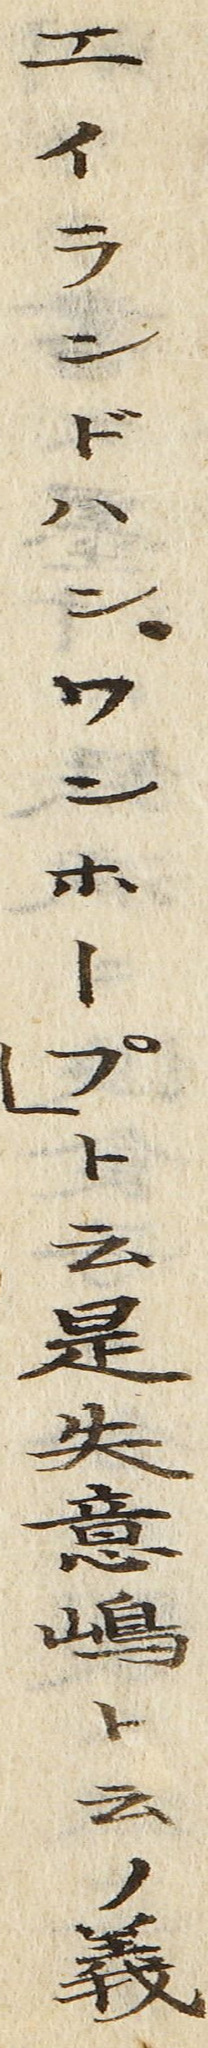エイランドハン・ワンホープ」ト云是失意島ト云ノ義
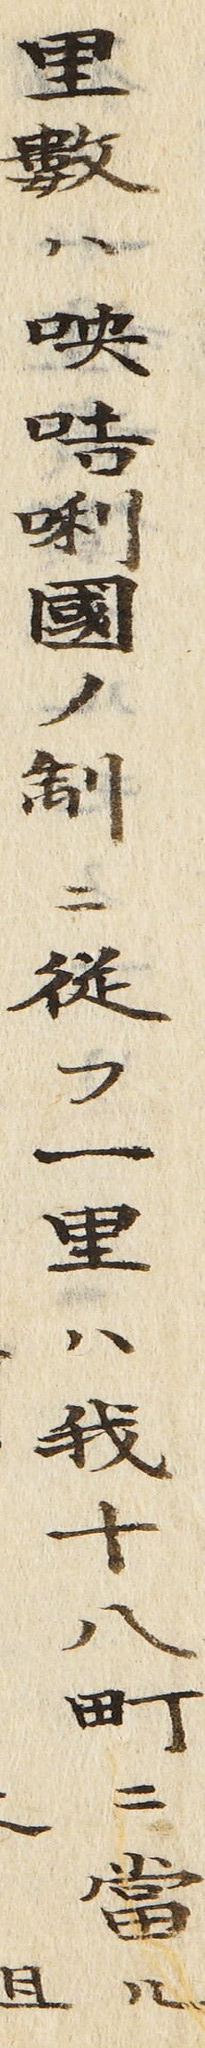里数ハ咉咭唎国ノ制ニ従フ一里ハ我十八町ニ当ル
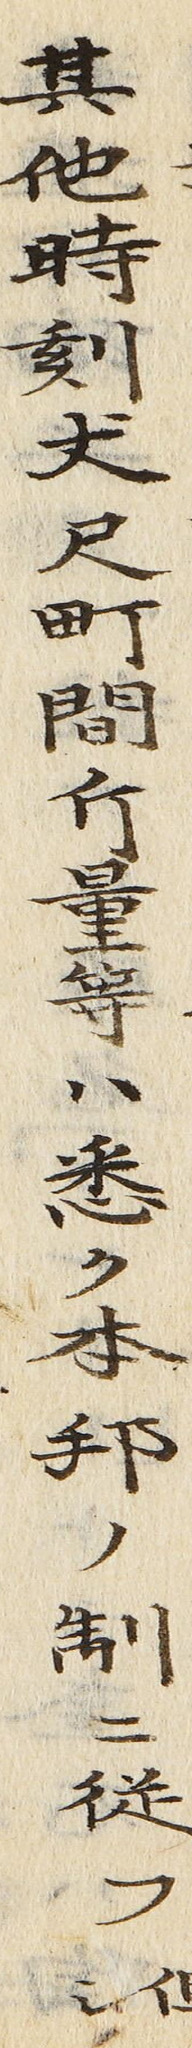其他時刻丈尺町間斤量ハ悉ク本邦ノ制ニ従フ但シ
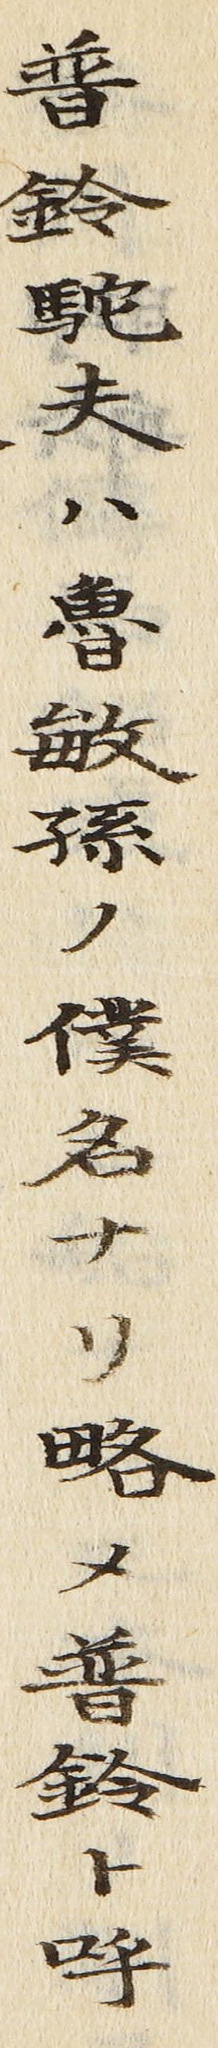普鈴駝夫ハ魯敏孫ノ僕名ナリ略シテ普鈴ト呼
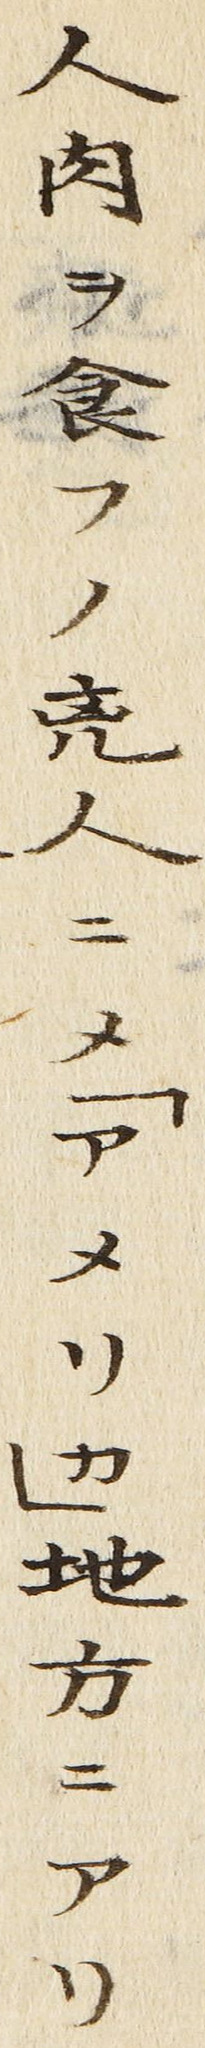人肉ヲ食フノ兇人ニシテ「アメリカ」地方ニアリ
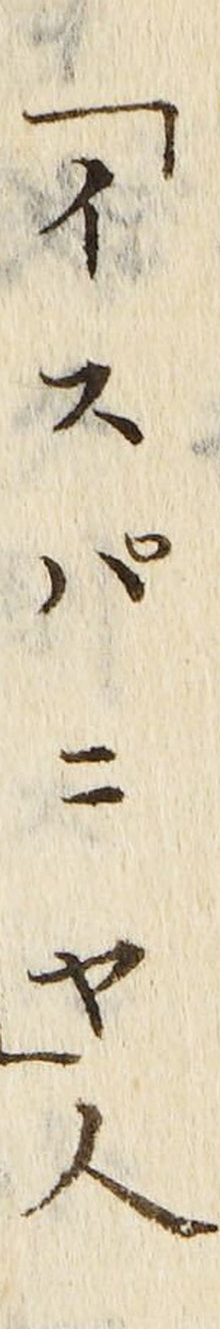「イスパニヤ」人
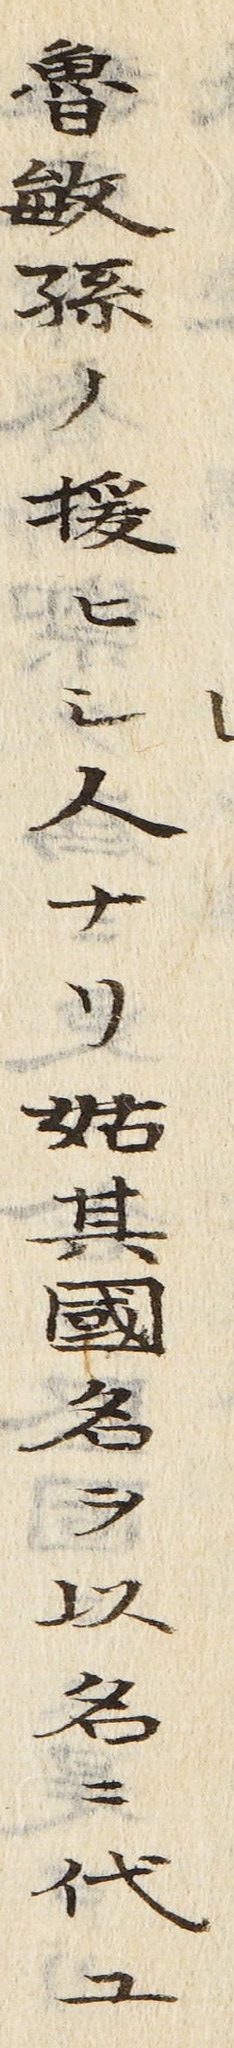魯敏孫ノ援ヒシ人ナリ姑其国名ヲ以名ニ代ユ
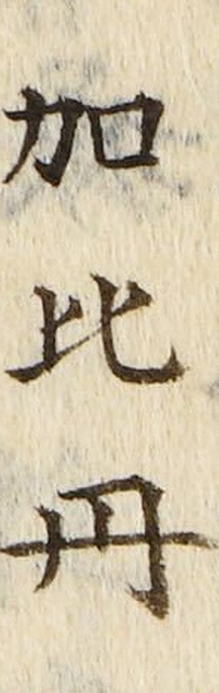加比丹
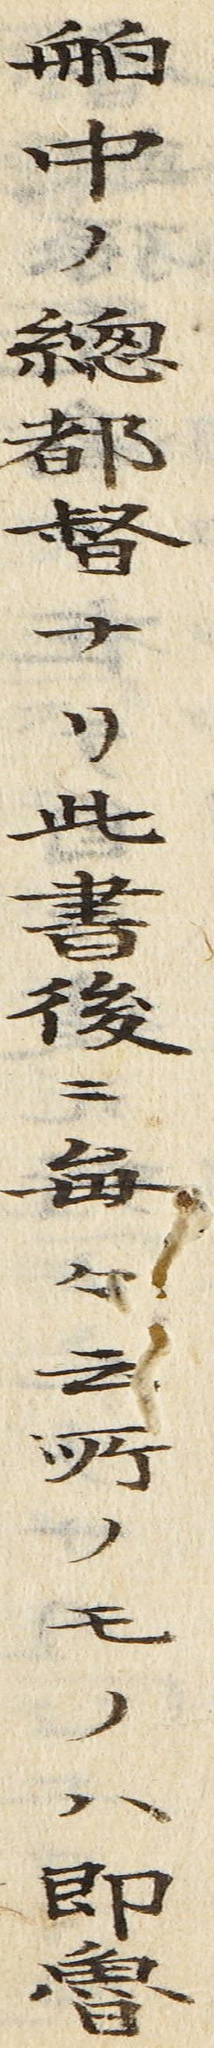舶中ノ総都督ナリ此書後ニ毎々云所ノモノハ即魯
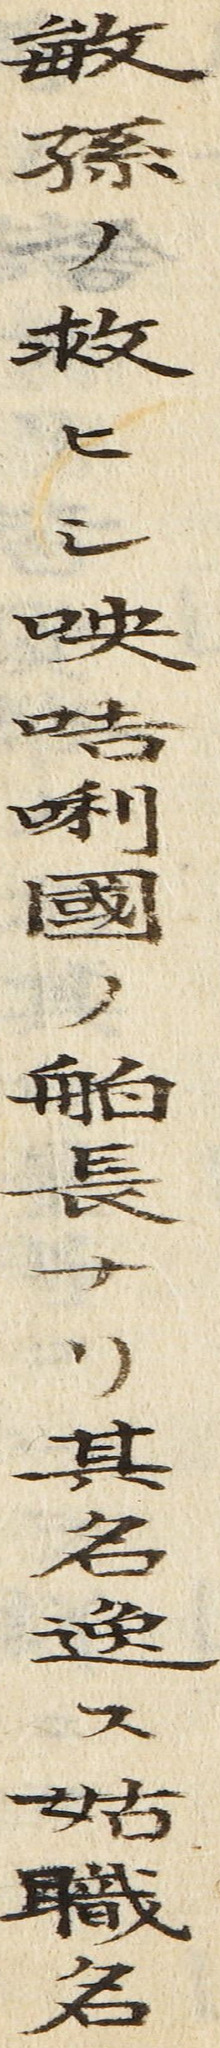敏孫ノ救ヒシ咉咭唎国ノ舶長ナリ其名逸ス姑職名
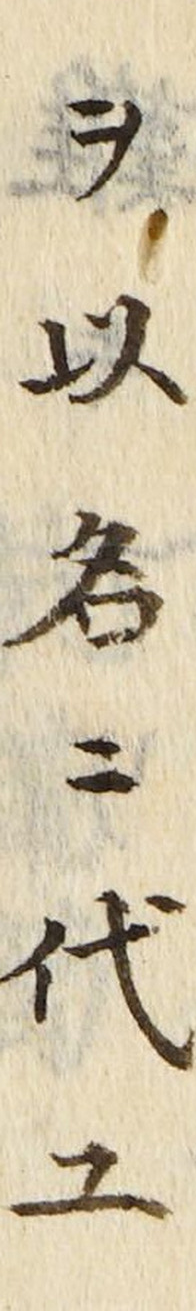ヲ以名ニ代ユ
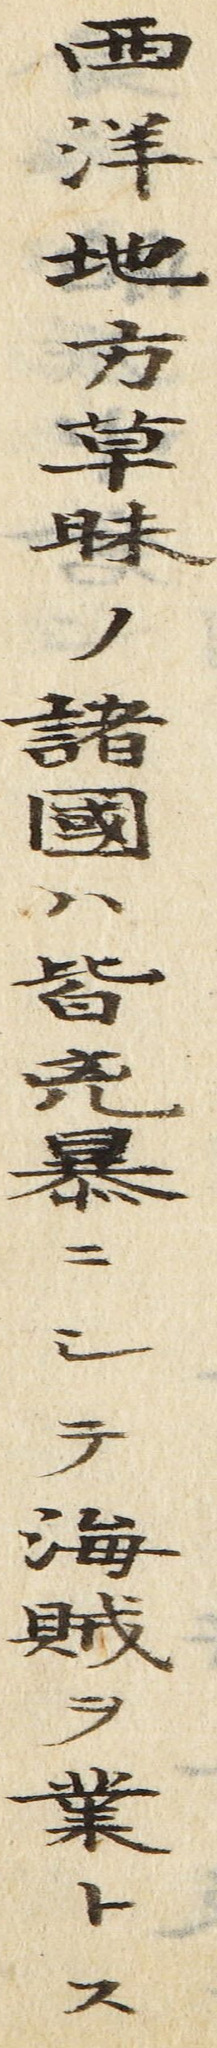西洋地方草昧ノ諸国ハ皆兇暴ニシテ海賊ヲ業トス

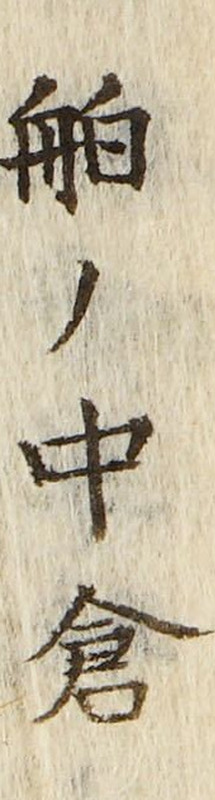舶ノ中倉
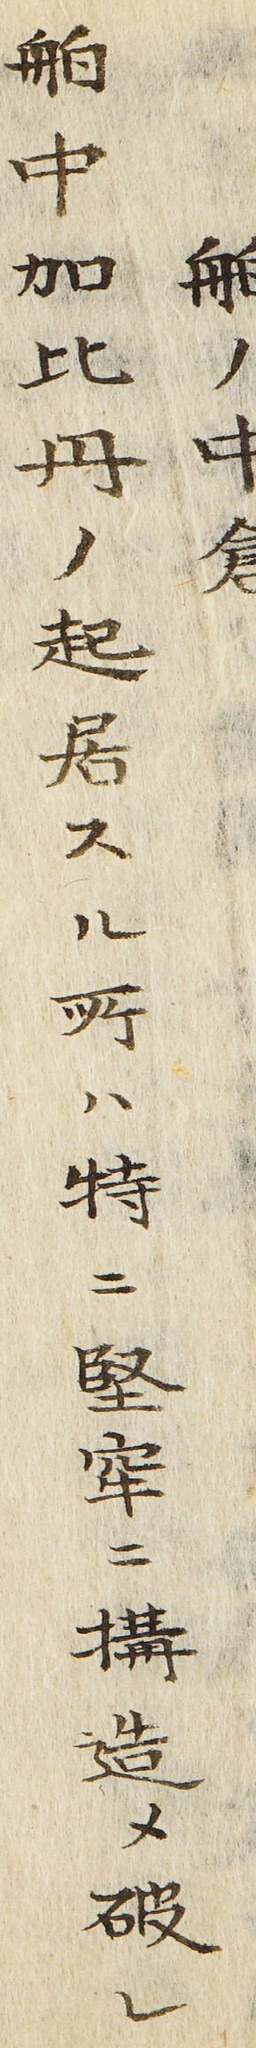舶中加比丹ノ起居スル所ハ特ニ堅牢ニ構造シテ破レ
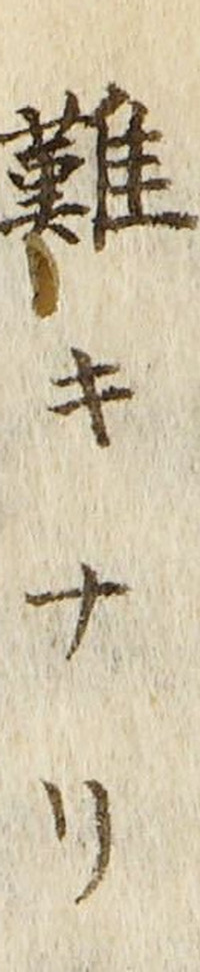難キナリ
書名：漂流紀事
